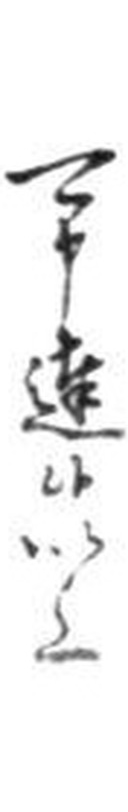可申達候以上
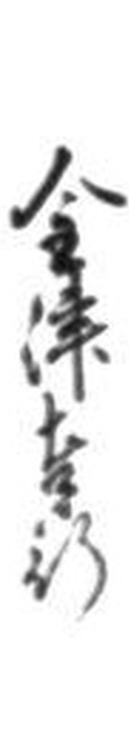金津奉行
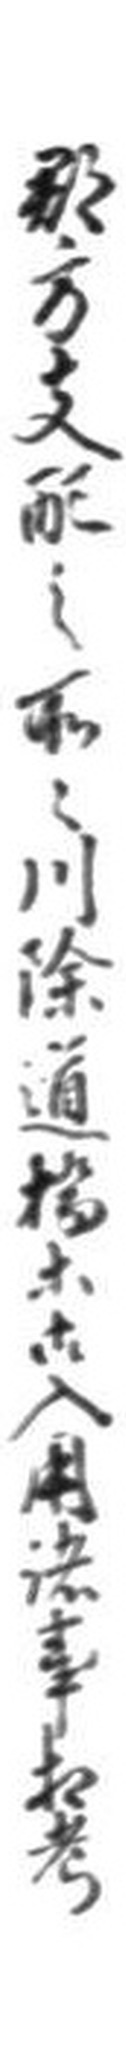郡方支配之所々川除道橋等御入用諸事相考
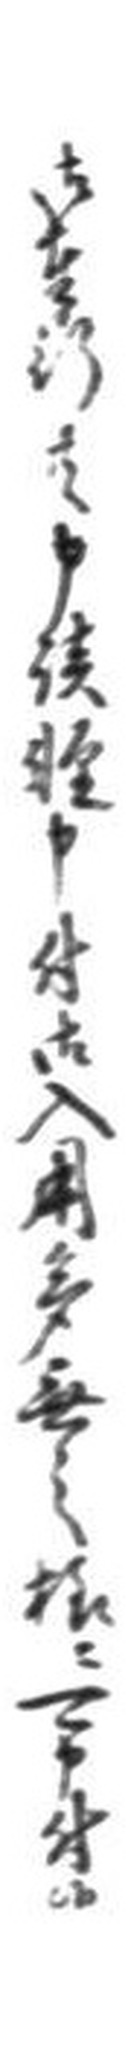御奉行共申談軽申付御入用多無之様ニ可申付候
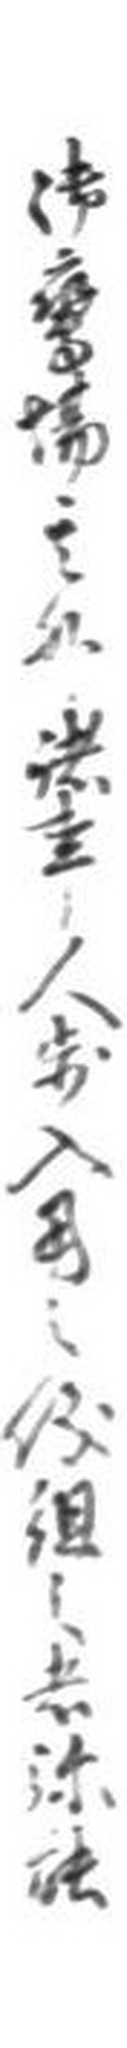御鷹場其外諸事人歩入用之儀組之者弥能
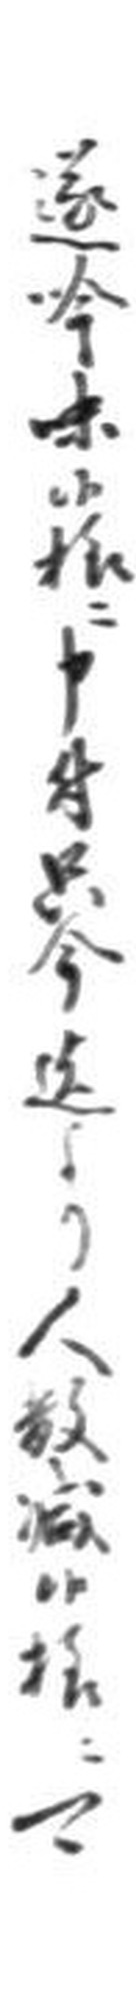遂吟味候様ニ申付只今迄より人数減候様ニ可
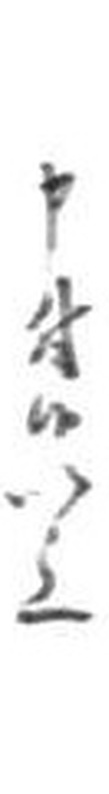申付候以上
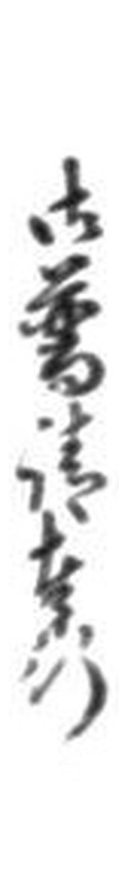御普請奉行
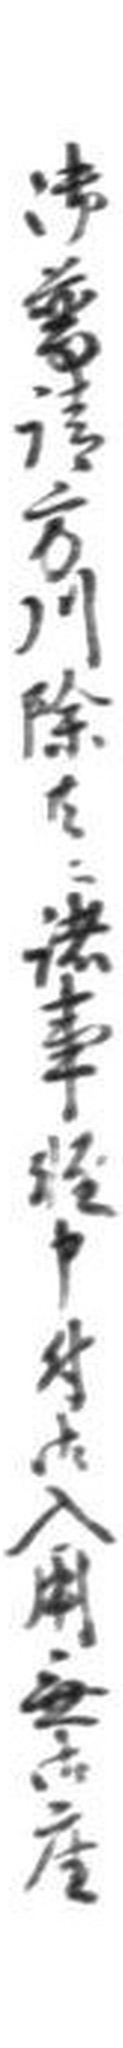御普請方川除共ニ諸事軽申付御入用無御座

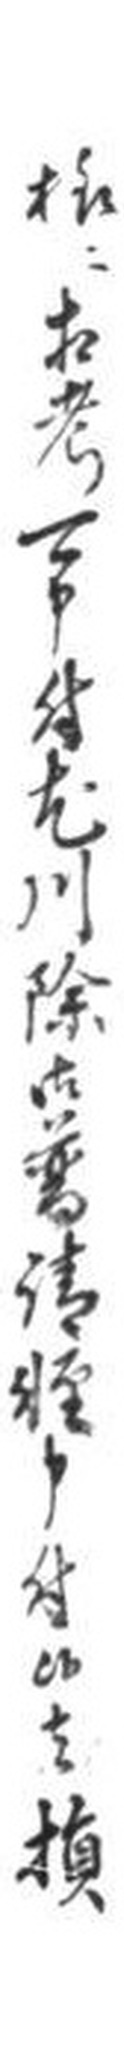様ニ相考可申付尤川除御普請軽申付候者損
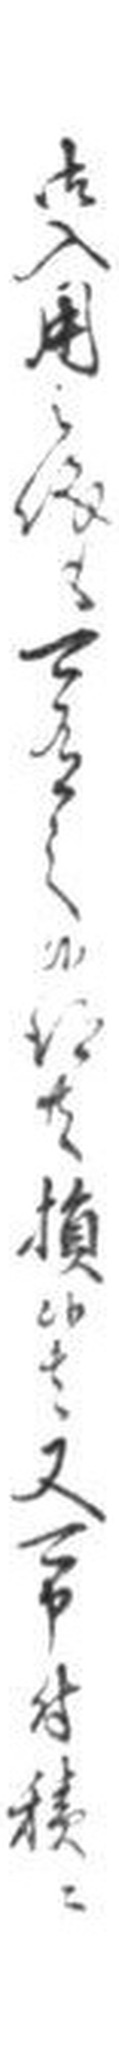御入用之儀も可有之候得共損候者ゝ又可申付積ニ
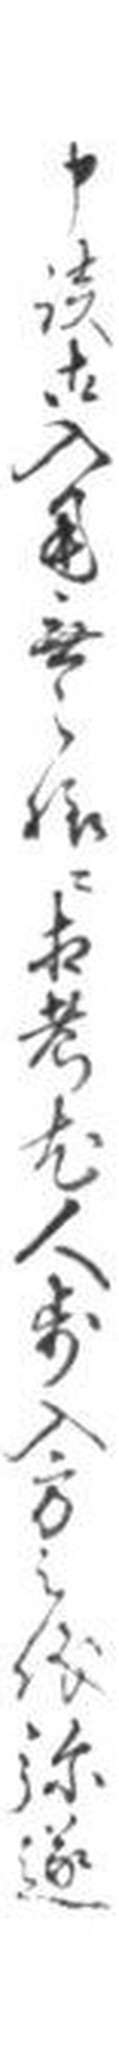申談御入用無之様ニ相考尤人歩入方之儀弥遂
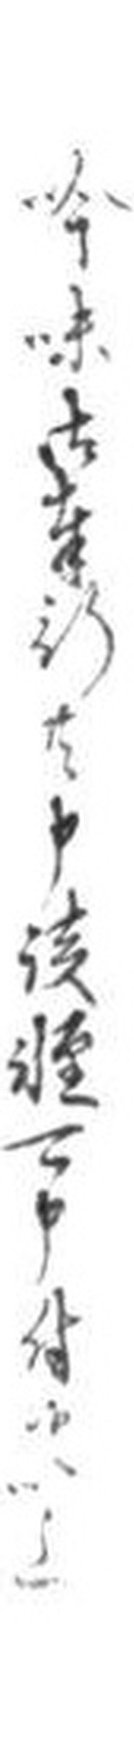吟味御奉行共申談軽可申付候以上
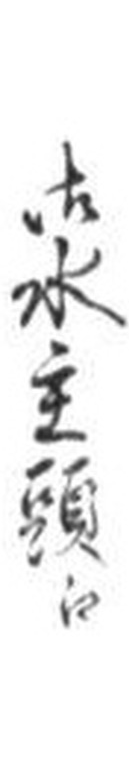御水主頭江
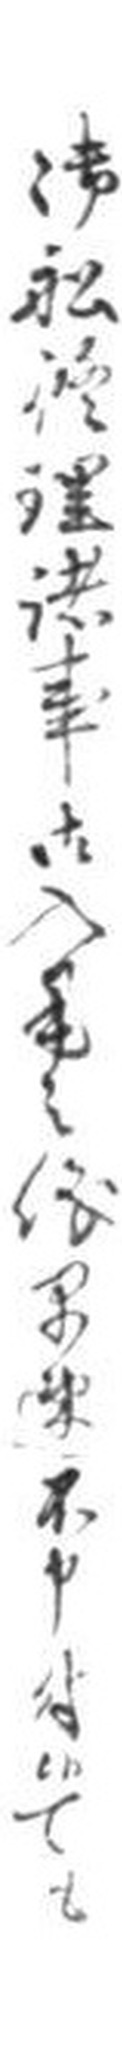御船修理諸事御入用之儀早速不申付候ても
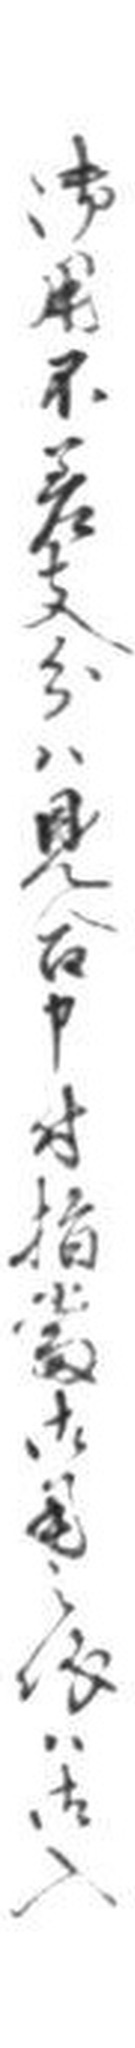御用不差支分ハ見合申付指当御用之儀ハ御入
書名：家譜 二十二 吉品公 従元禄十五年到同十六年
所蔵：福井県文書館 Fukui Prefectural Archives
